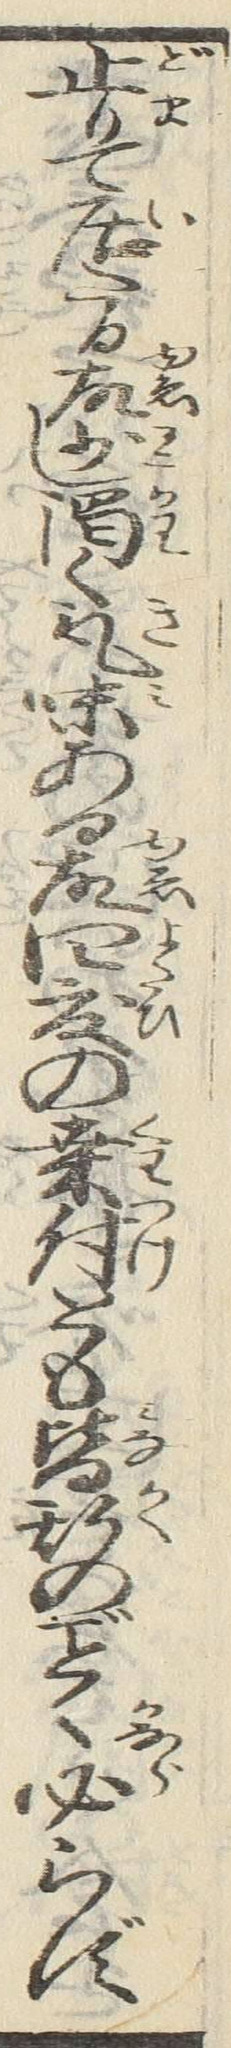止りて居たる故少し渇く気味ある故四度の桑付とも皆斯のごとく必らず
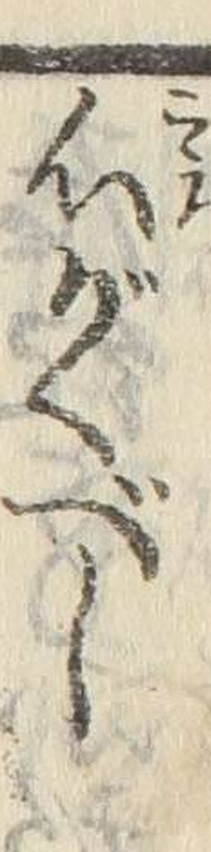心がくべし
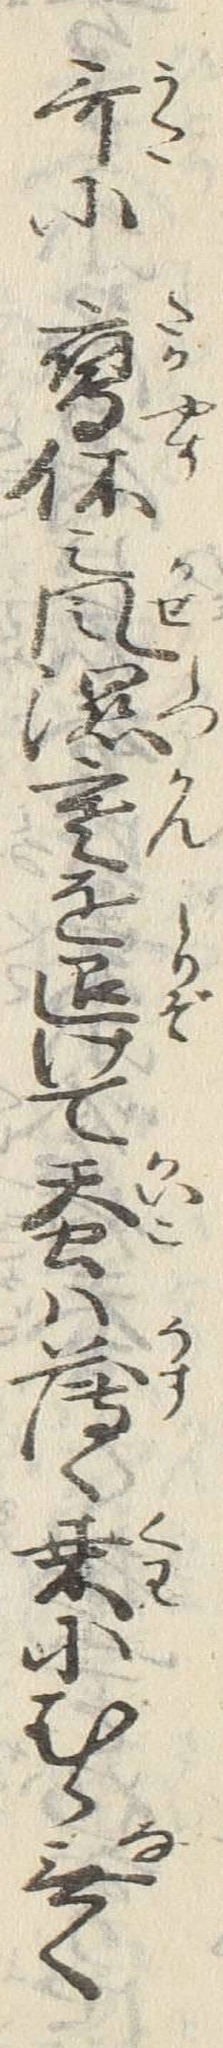哥に鷹休み風湿寒を退けて蚕は薄く桑にむら無く
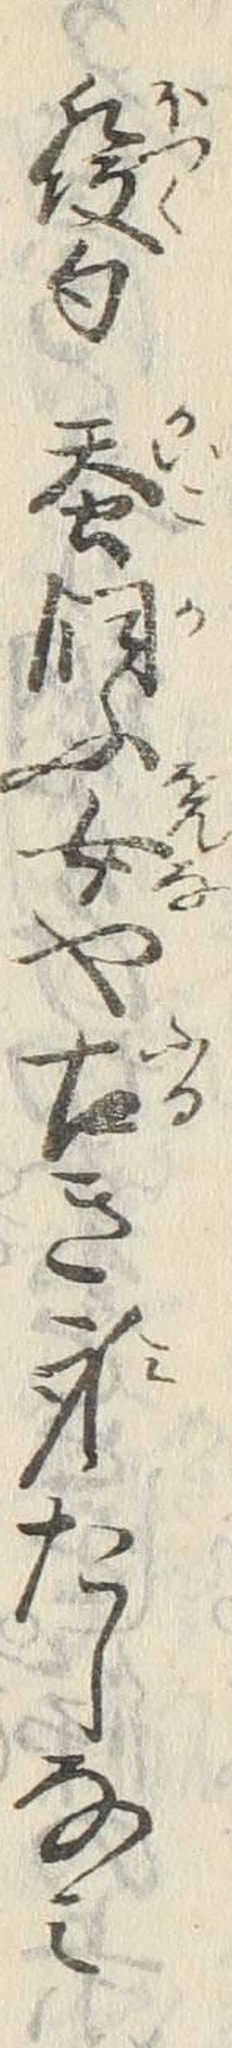發句蚕飼ふ女や古き身たしなみ
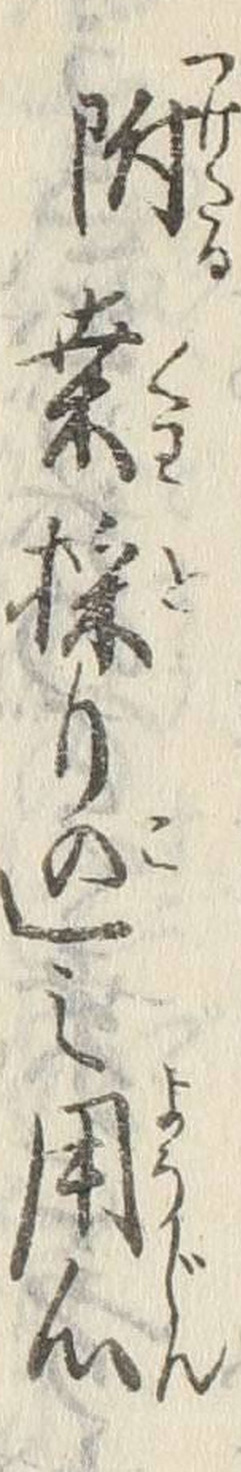附桑採り込み用心
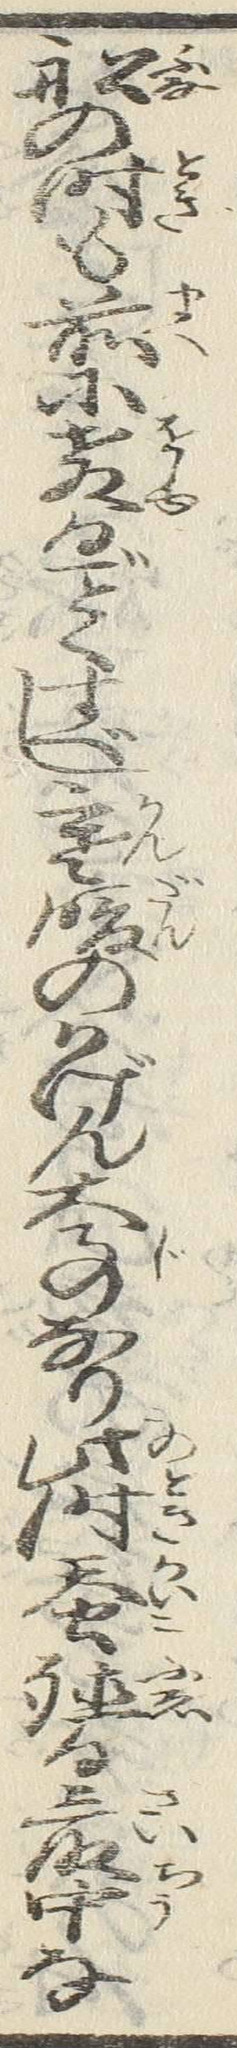舩の時も前に教るごとくすべし寒暖のかげん大事なり此時蚕殖る㝡中な
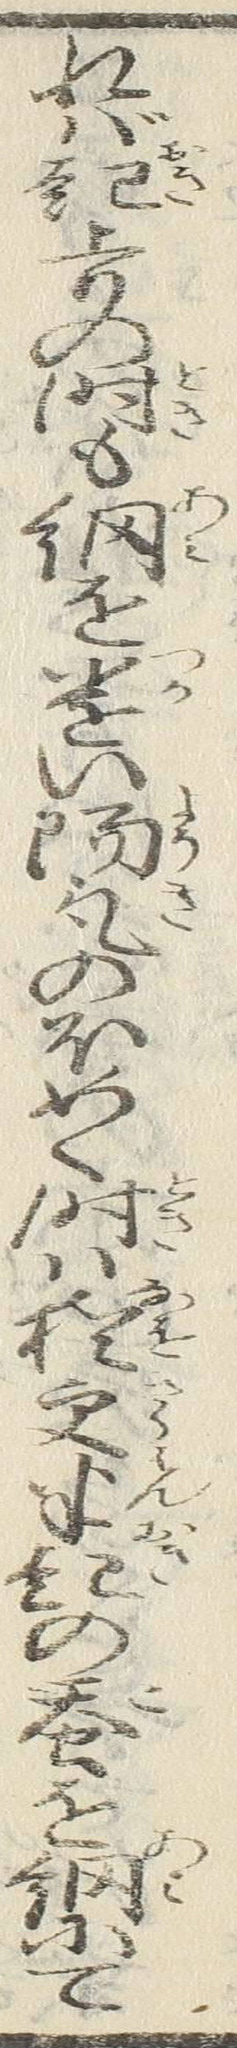れば起上りの時も網を遣い陽気のほめく時は猶更半起の蚕を網にて
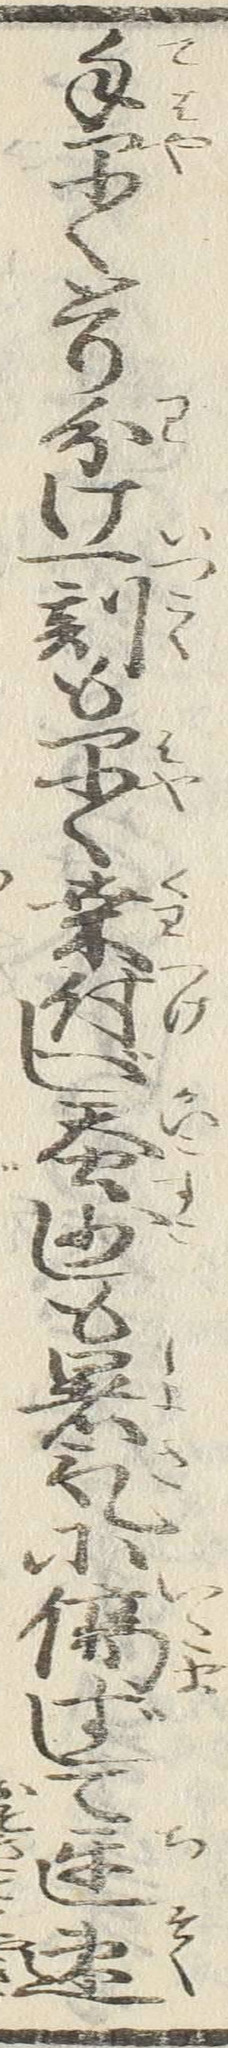手早くとり分け一刻も早く桑付べし蚕少しも暑気に傷ずして遅速
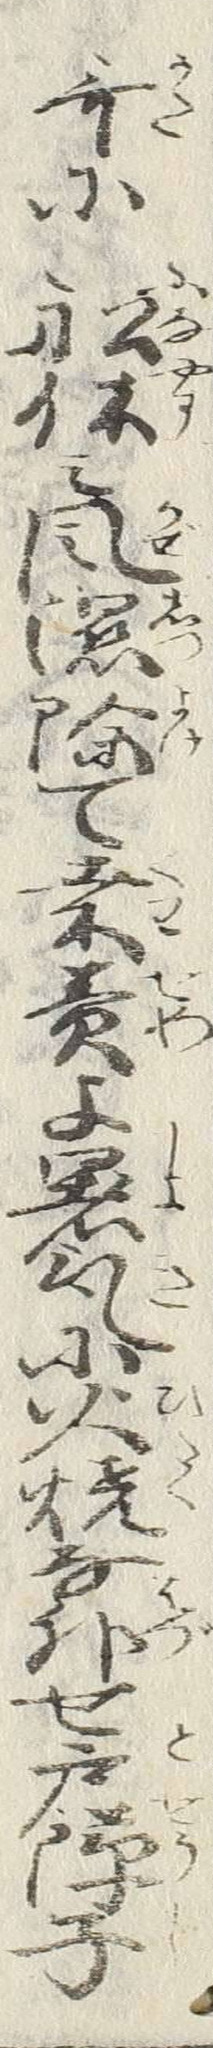哥に舩休み風湿除て桑責よ暑気に火焼な外せ戸障子
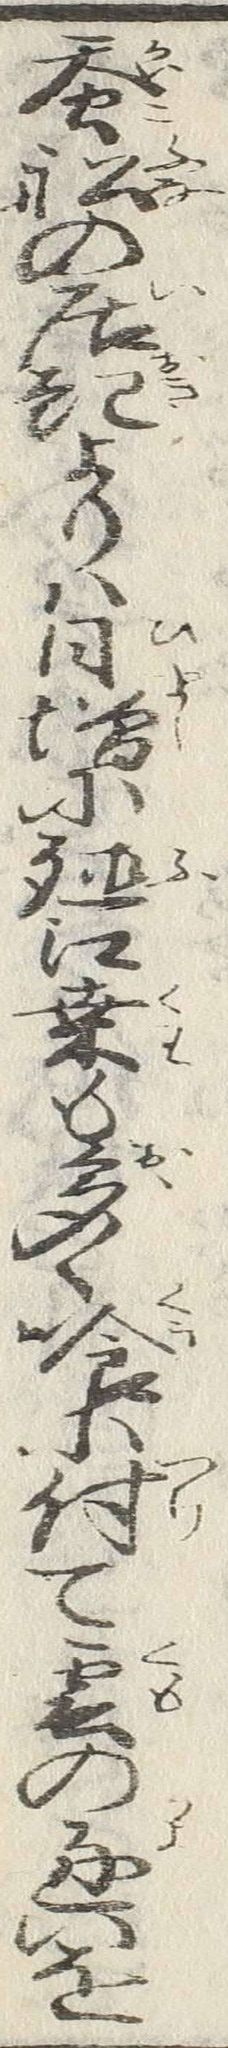蚕舩の居起よりは日増に殖え桑も多く喰に付て雲の通いを
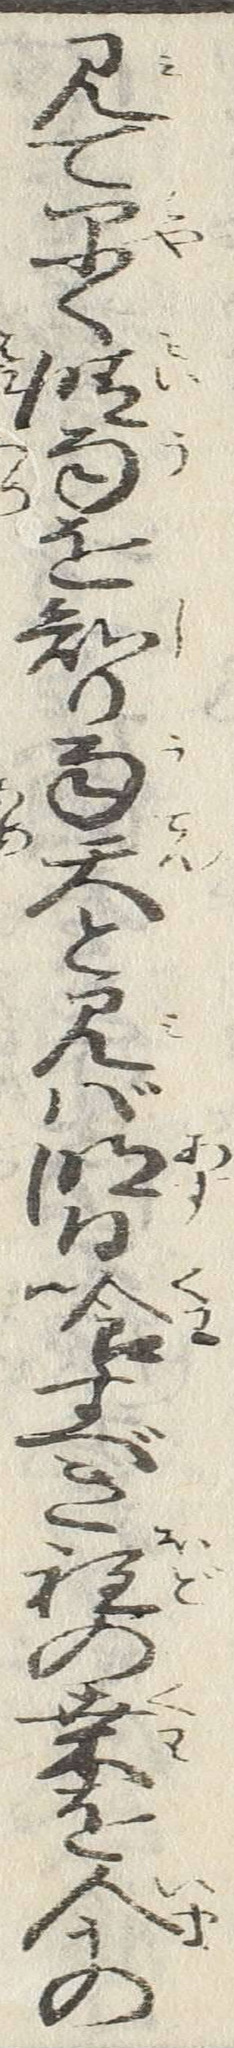見て早く晴雨を知り雨天と見ば明日喰すべき程の桑を今の
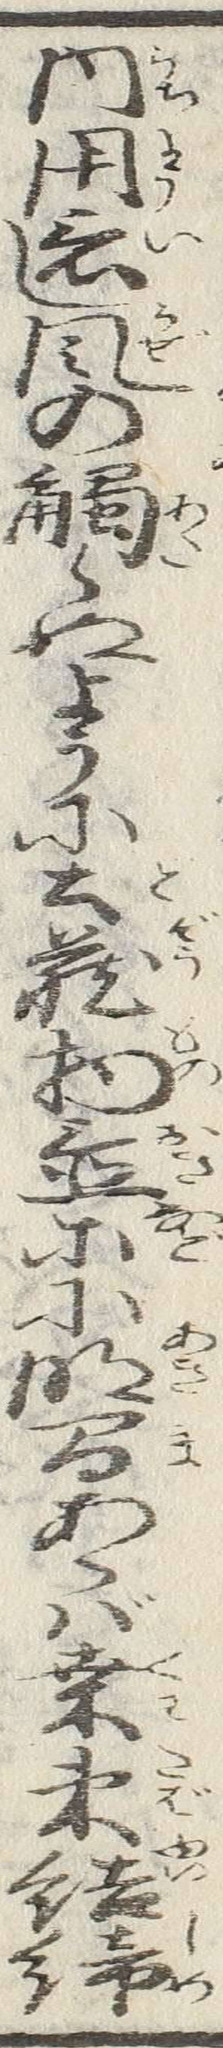内用意し風の觸らぬように土蔵物置等に明間あらば桑束結締
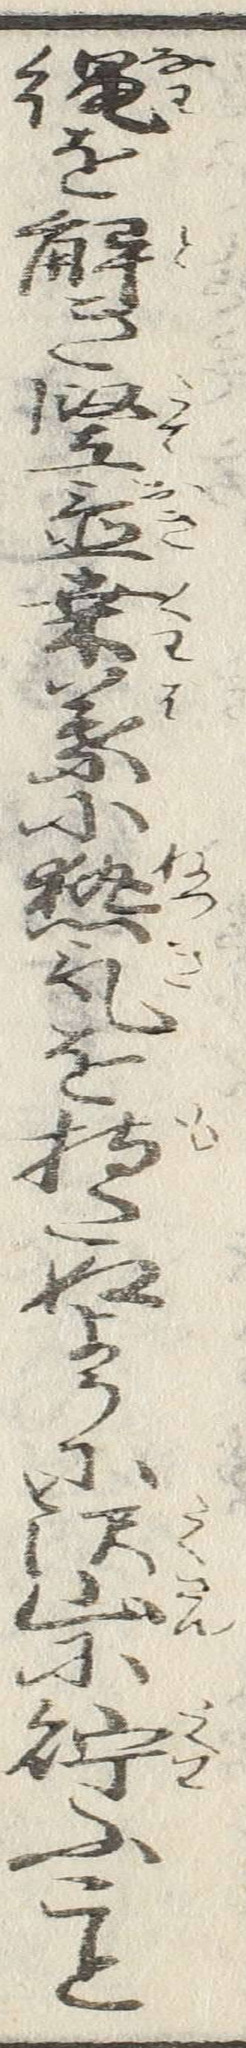縄を解き竪置桑葉に熱気を持たぬように沢山に貯ふこと
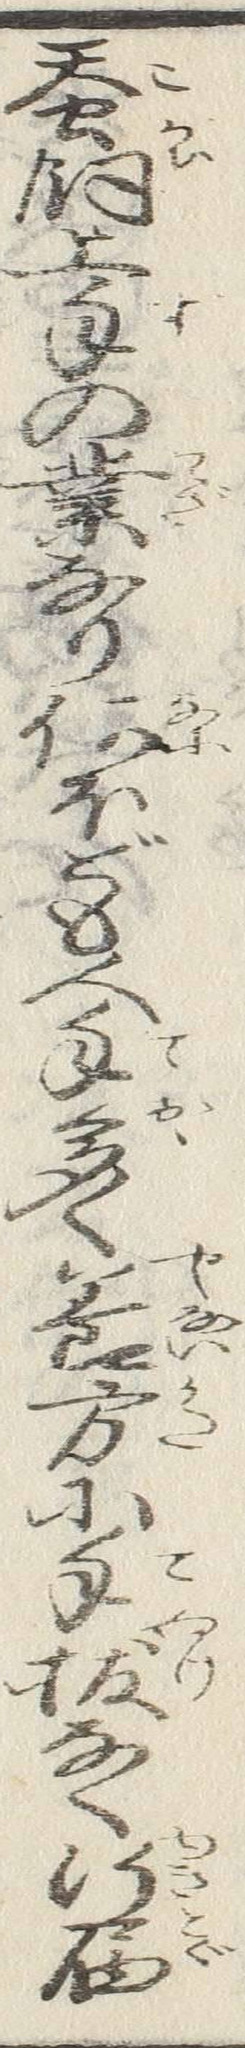蚕飼上手の業なり何ほども人手多く養方に手抜なく行届
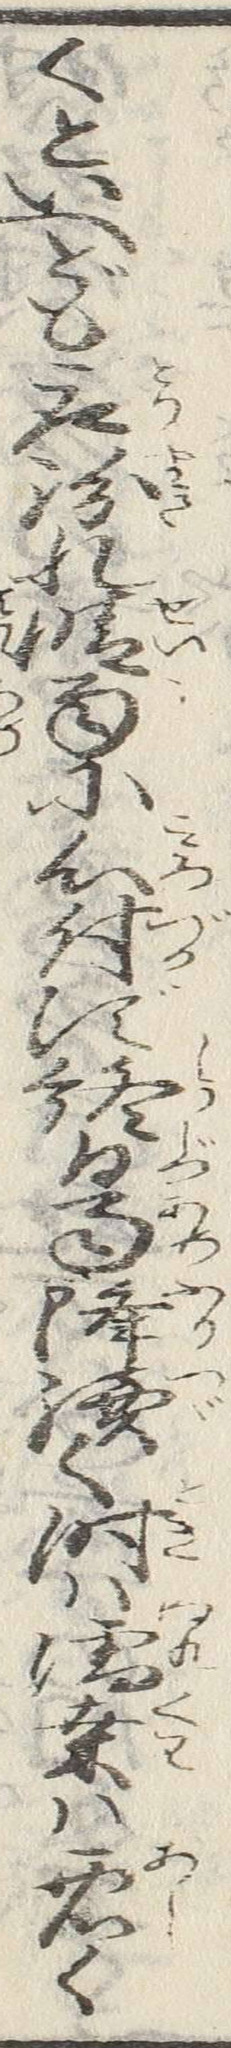くといへども取紛れ晴雨に心付ず終日雨降續く時は濡桑は悪く
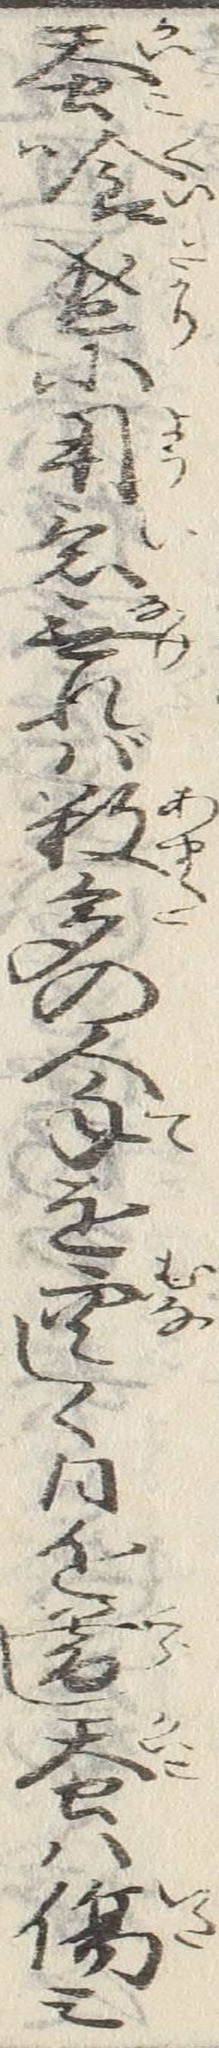蚕喰盛に用意無れば数多の人手を空しく日を暮し蚕は傷み
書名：養蠶實驗録
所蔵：東京大学農学生命科学図書館 国文学研究資料館
